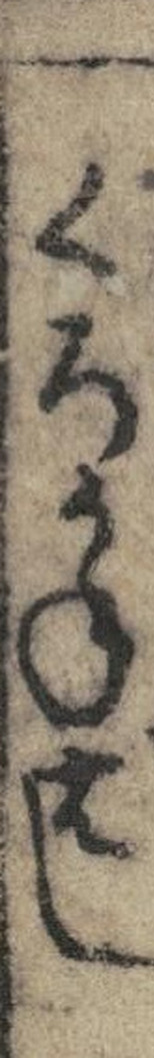くろかねはし
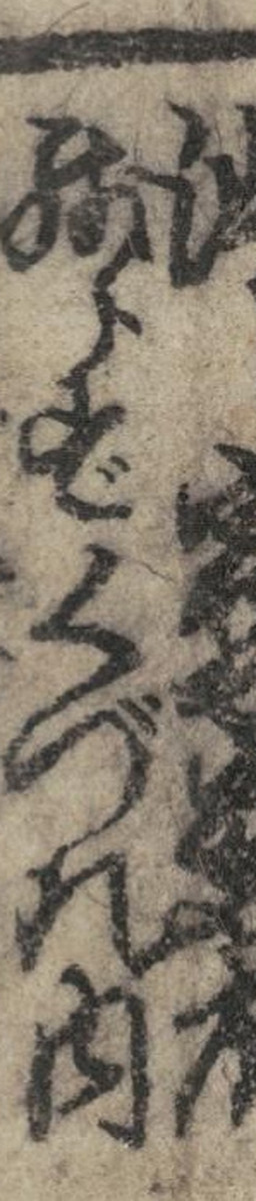残らずくづれ内
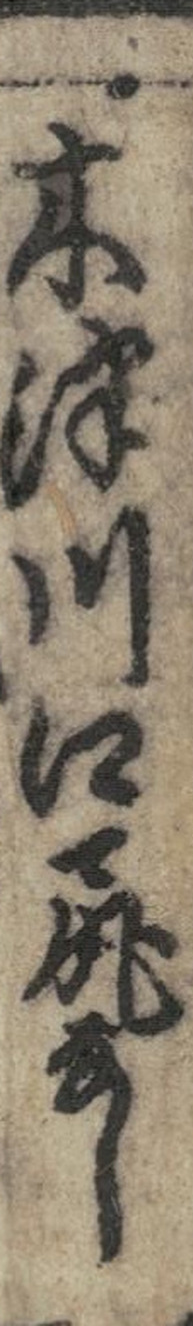木津川口尻なし
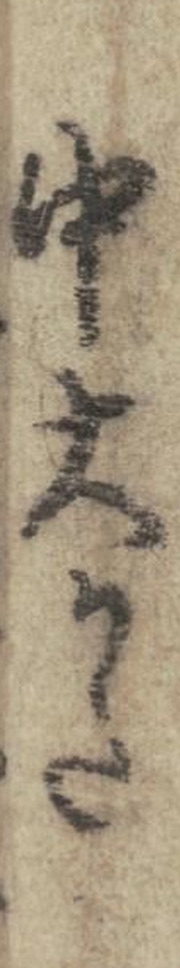中大かた
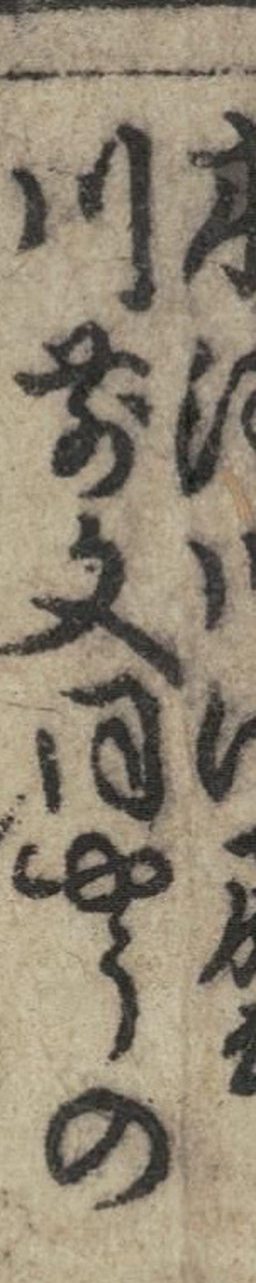川前又同やうの
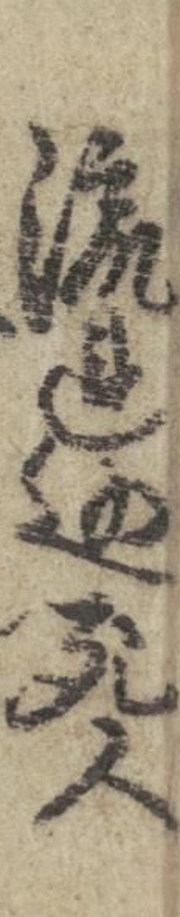流れ込死人
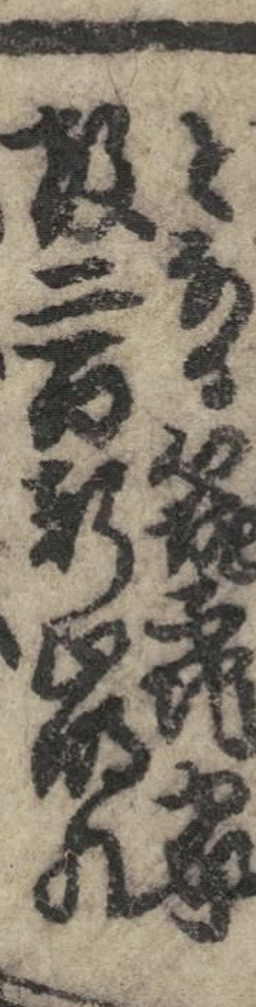数二百軒崩れ
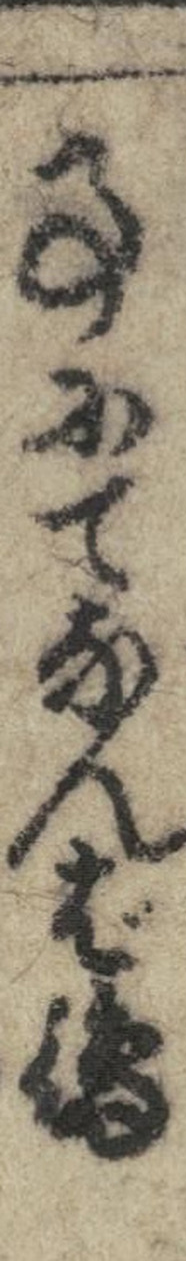事にてなんば嶋
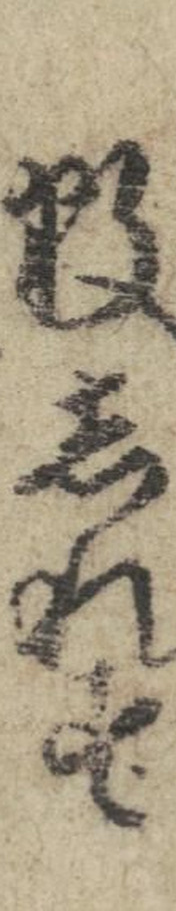数しれす
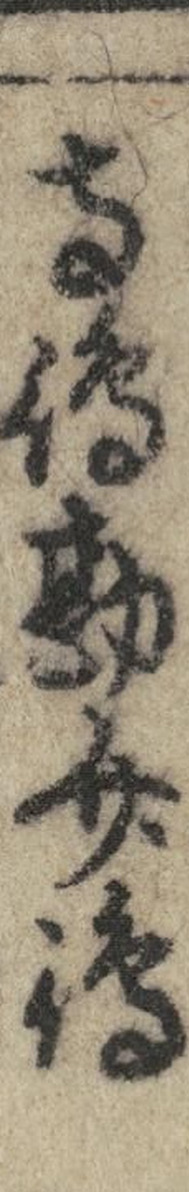寺嶋勘介嶋
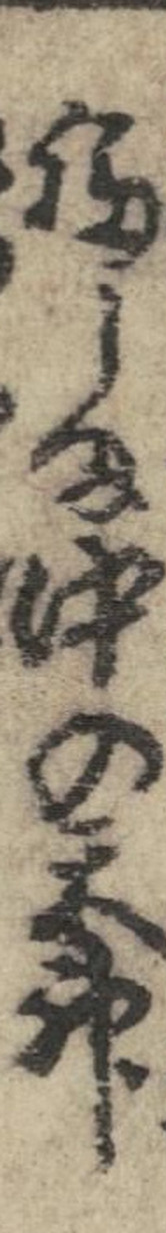福しま中の天神
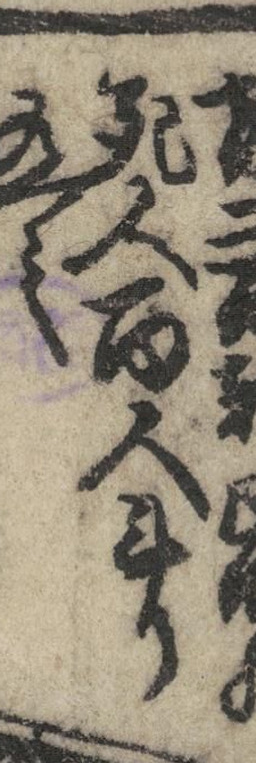死人百人計り
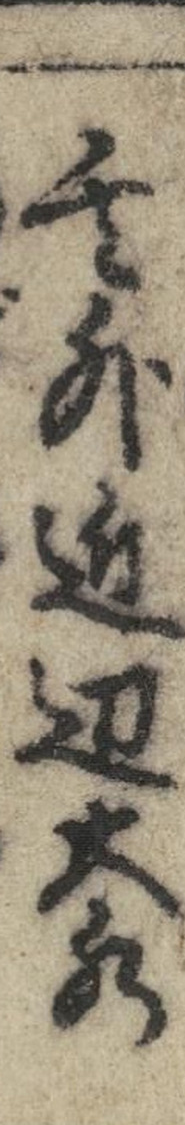其外近辺大水
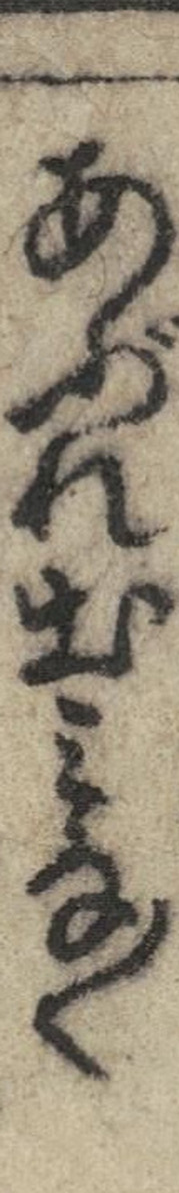あぶれ出みな〳〵
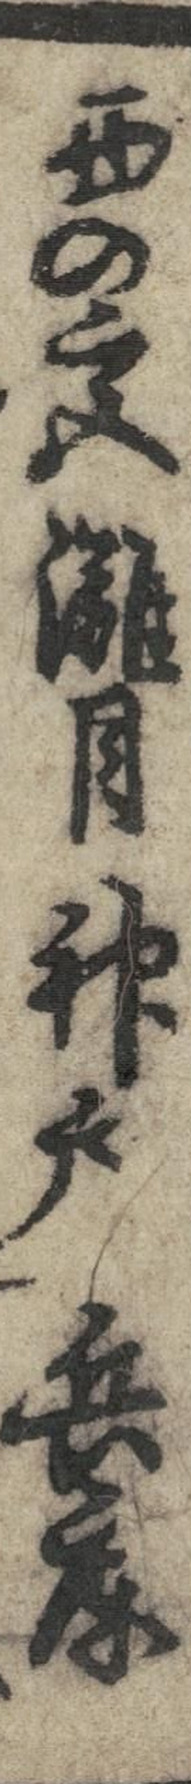西の宮灘目神戸兵庫
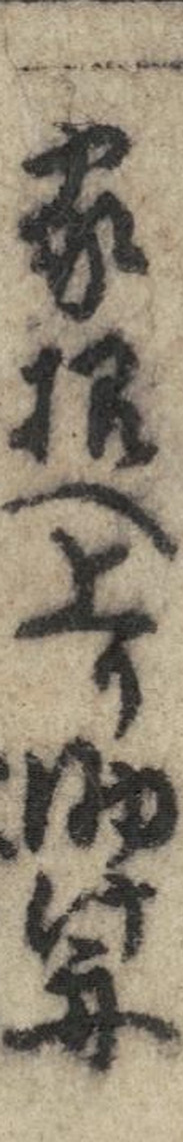家根へ上り助け舟
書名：諸国大阪太地震大つなミ末代噺
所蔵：東京大学地震研究所図書室 Earthquake Research Institute Library, The University of Tokyo, JAPAN
